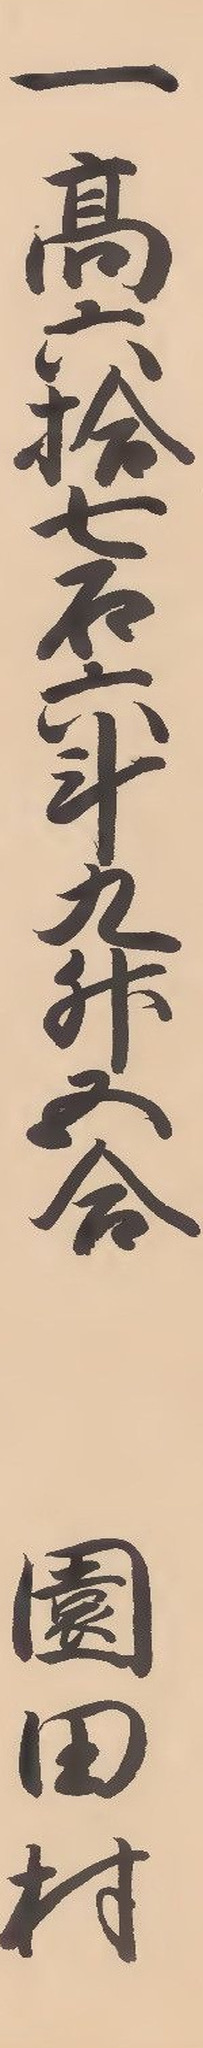一高六拾七石六斗九升五合園田村
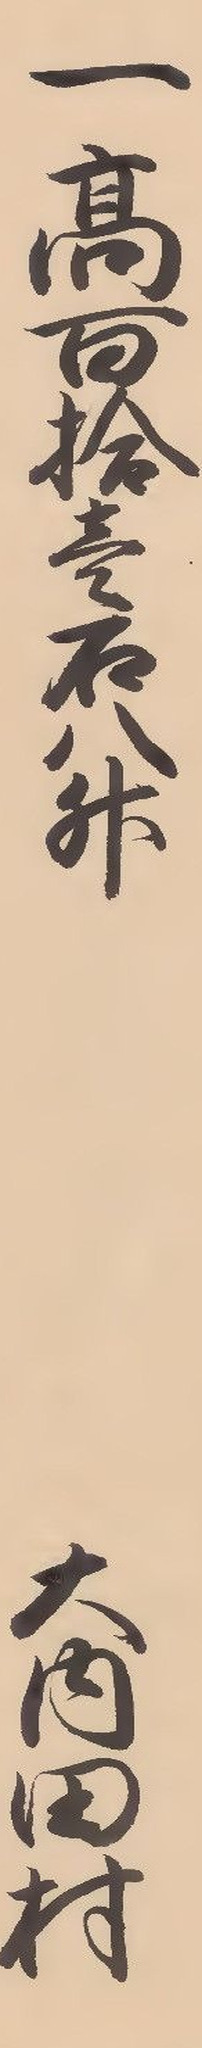一高百拾壱石八升大内田村
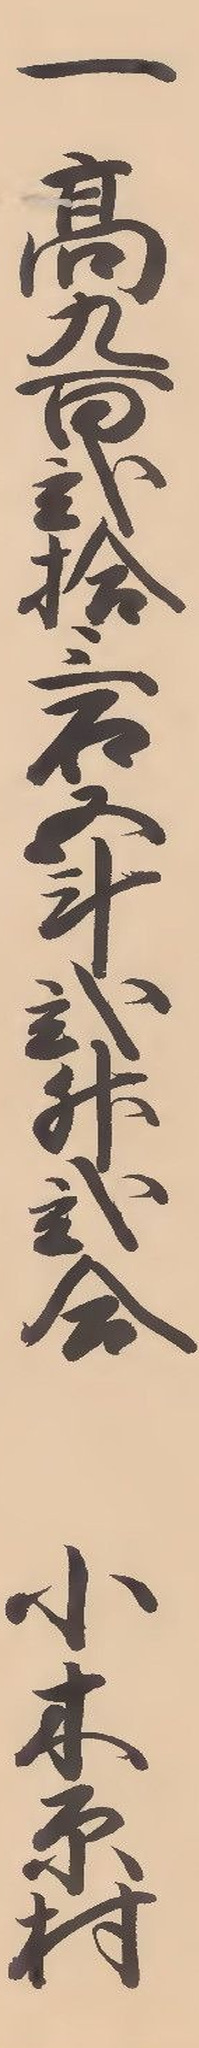一高九百弐拾三石五斗弐升弐合小木原村
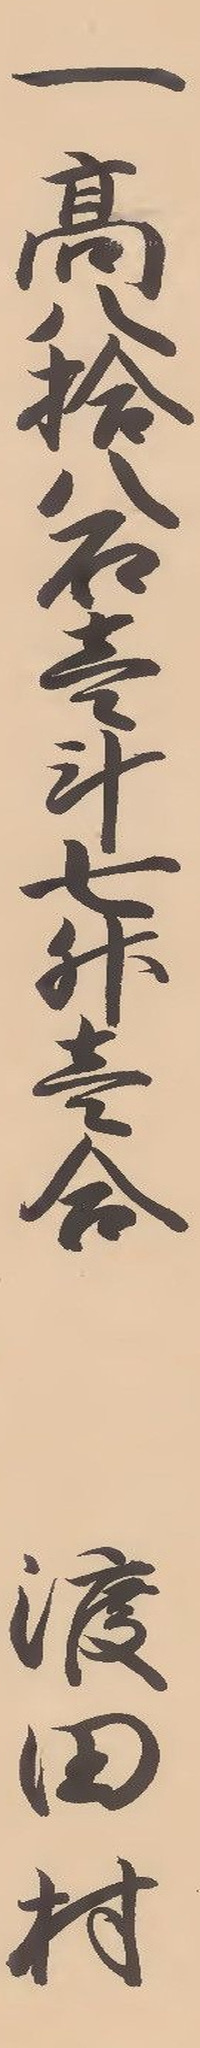一高八拾八石壱斗七升壱合渡田村
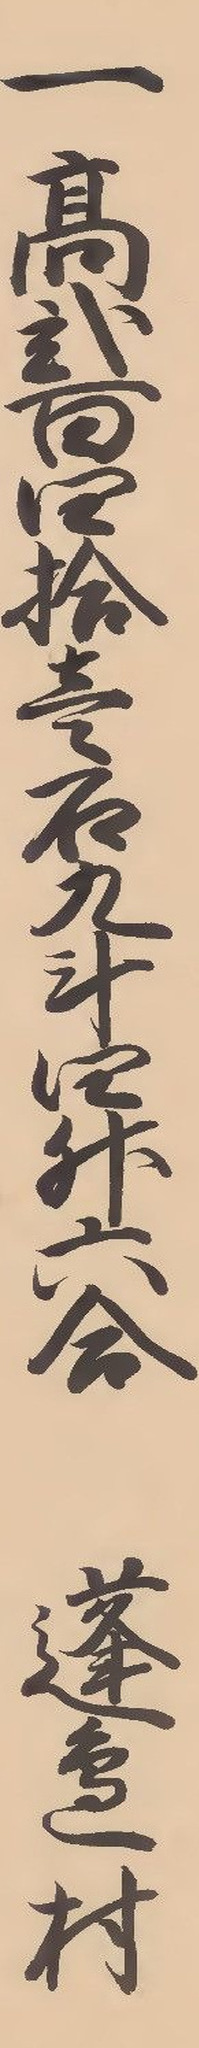一高弐百四拾壱石九斗四升六合蓬辺村
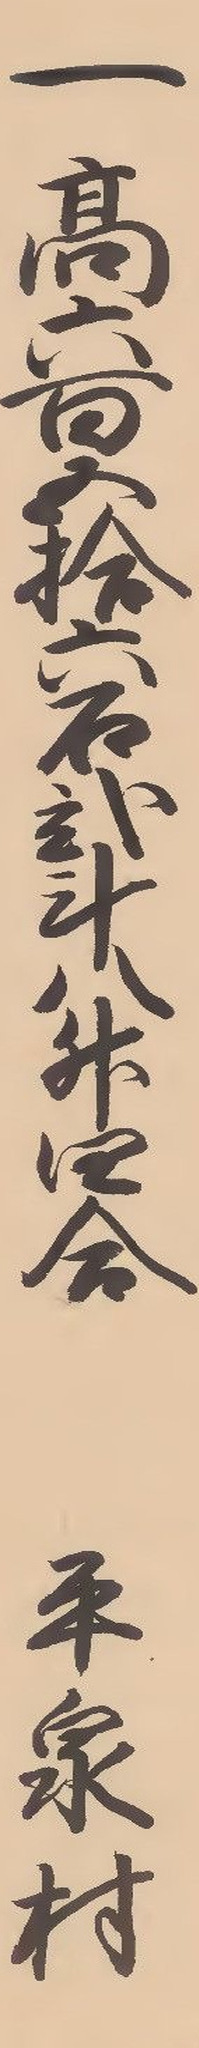一高六百五拾六石弐斗八升四合平泉村
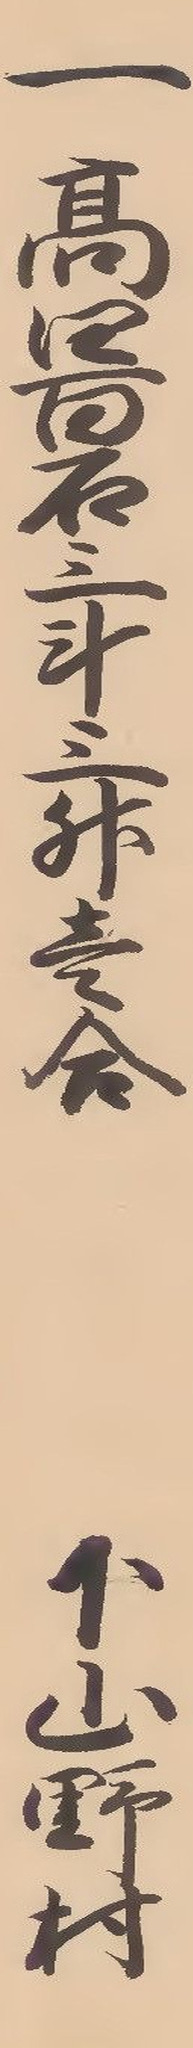一高四百石三斗三升壱合下山野村

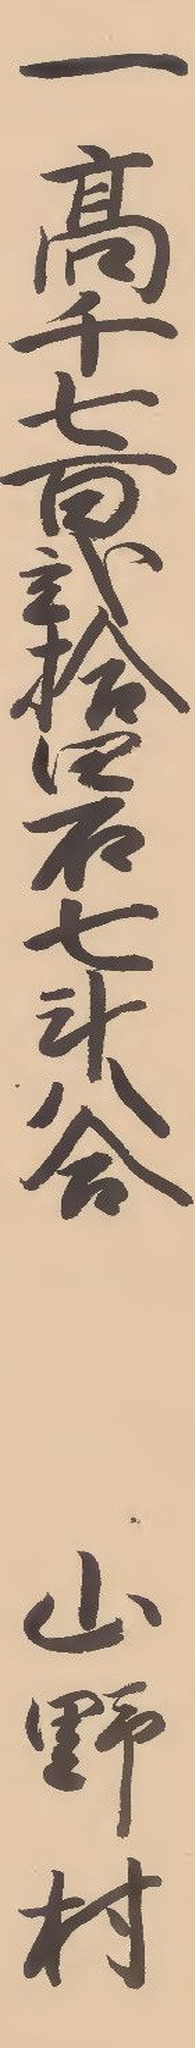一高千七百弐拾四石七斗八合山野村
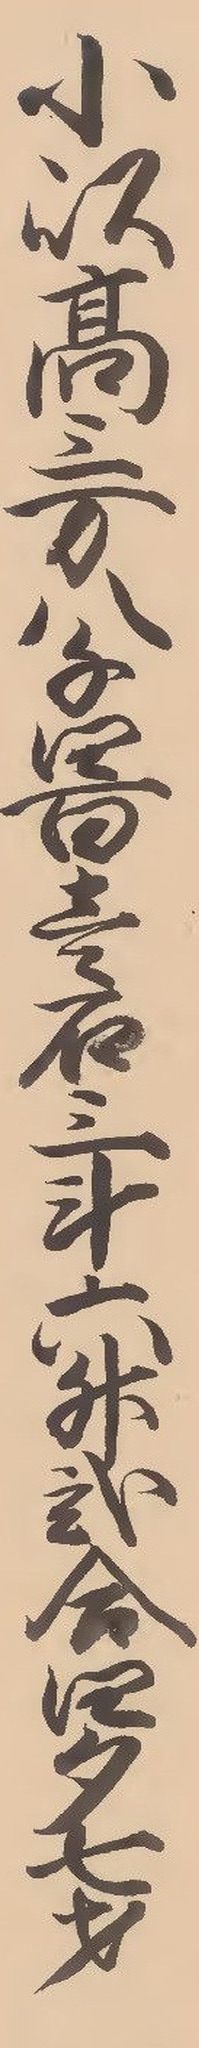小以高三万八千四百壱石三斗六升弐合四勺七才
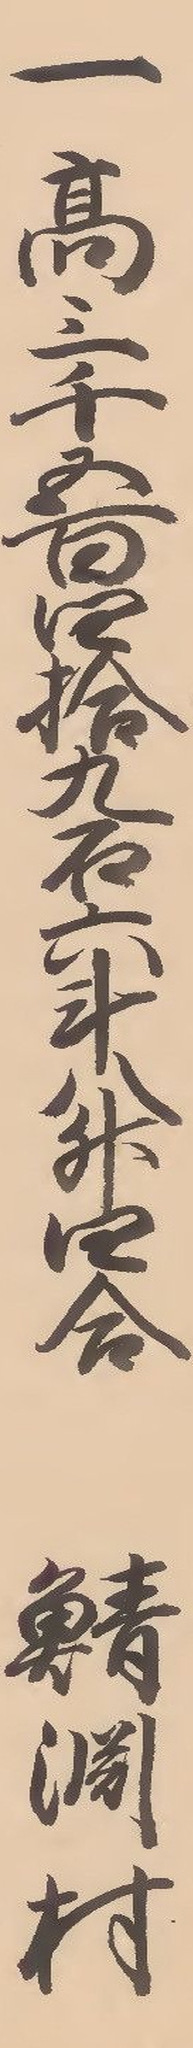一高三千五百四拾九石六斗八升四合鯖渕村
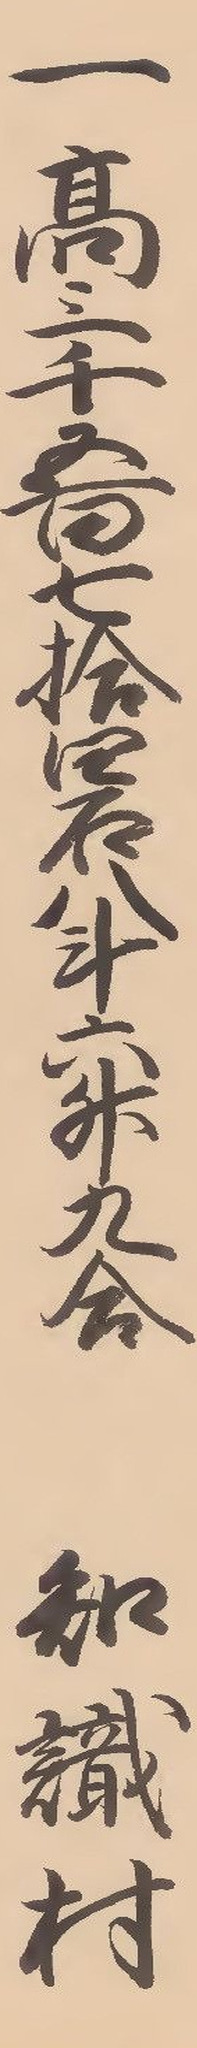一高三千五百七拾四石八斗六升九合知識村
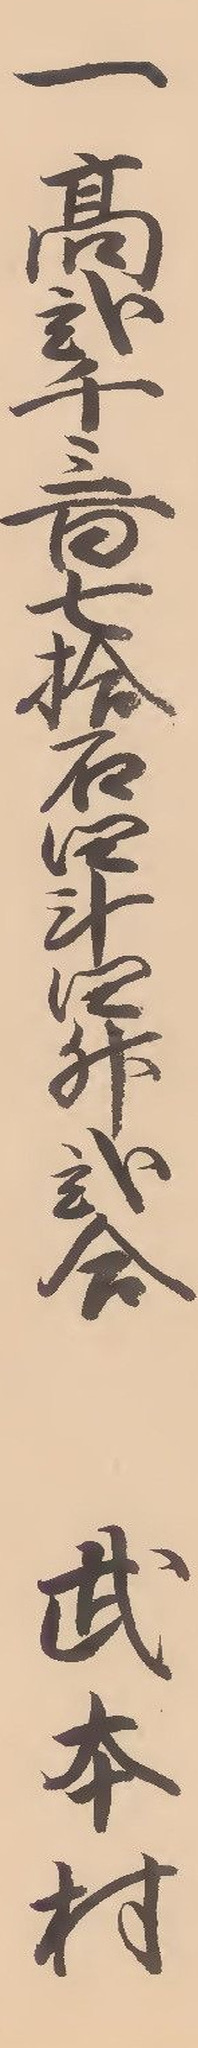一高弐千三百七拾石四斗四升弐合武本村

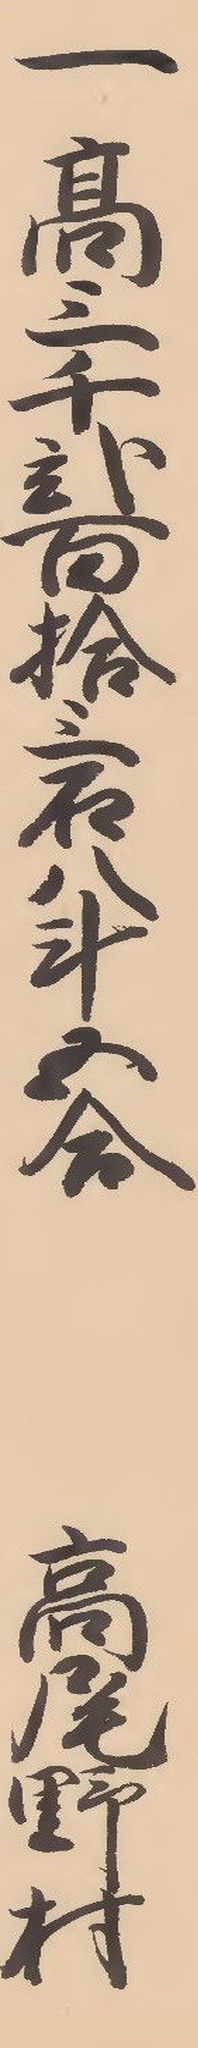一高三千弐百拾三石八斗五合高尾野村
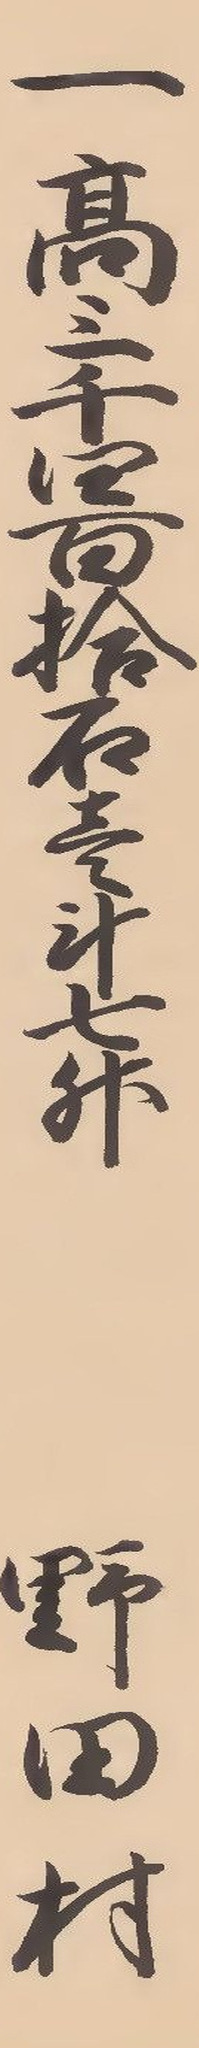一高三千四百拾石壱斗七升野田村
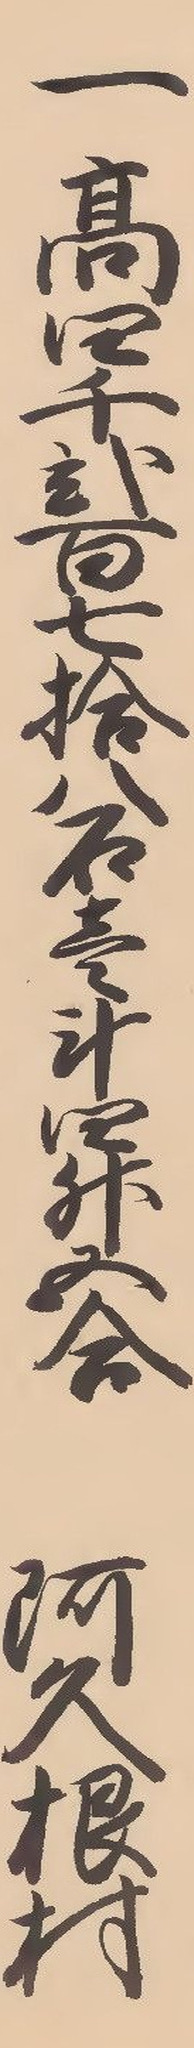一高四千弐百七拾八石壱斗四升五合阿久根村
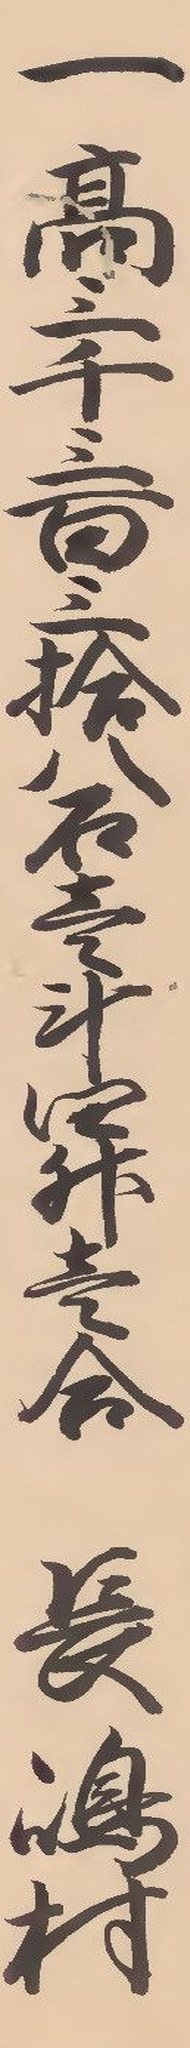一高三千三百三拾八石壱斗四升壱合長島村
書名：薩摩国郷帳
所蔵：国立公文書館 National Archives of Japan
